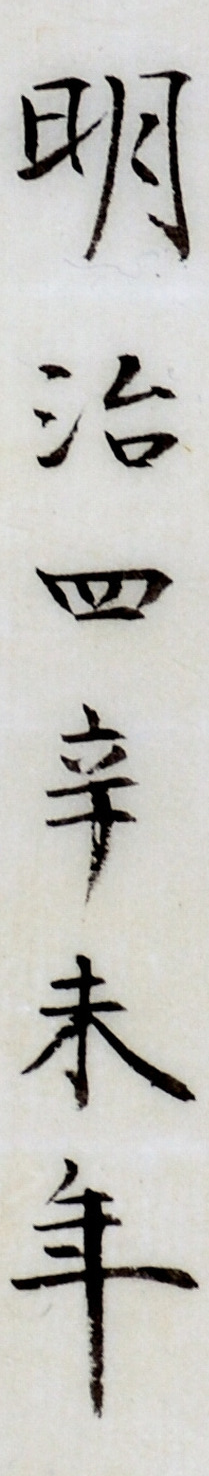明治四辛未年
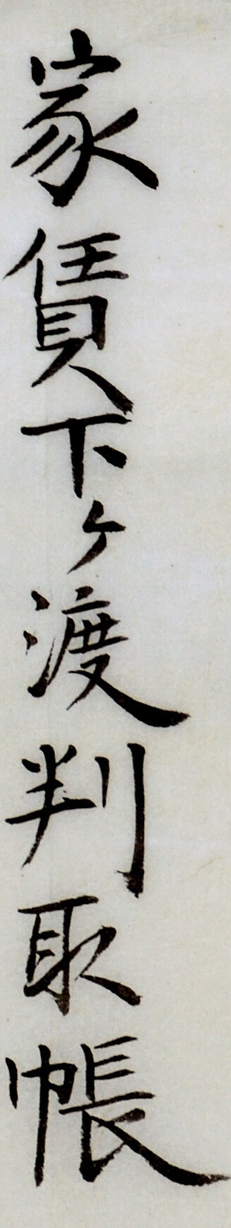家賃下ケ渡判取帳
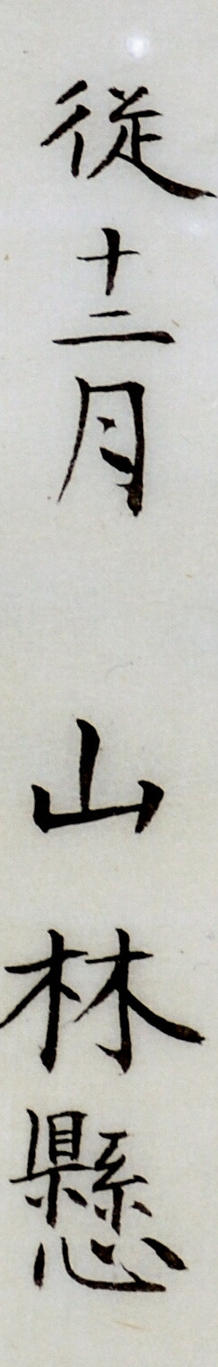従十二月山林懸

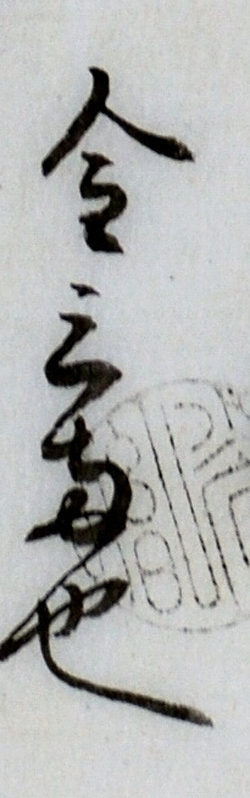金三両也
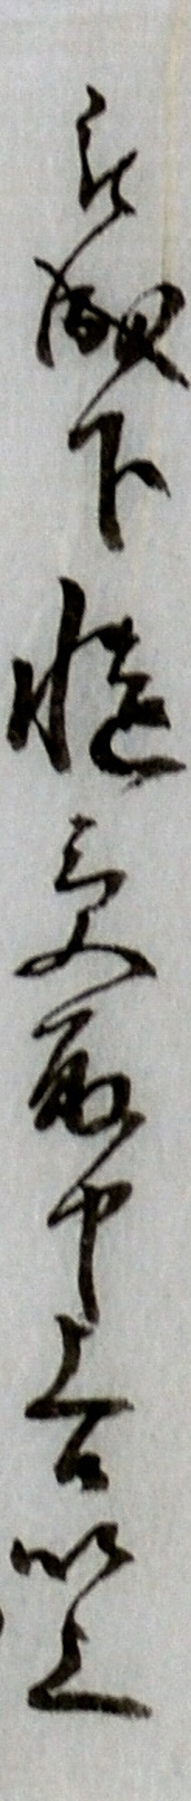被成下慥受取申上候以上
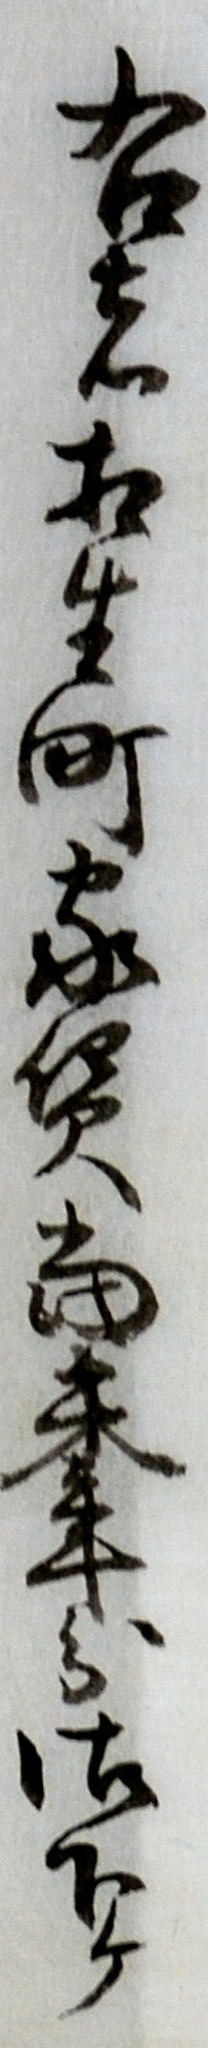右者相生町家賃当未年分御下ケ
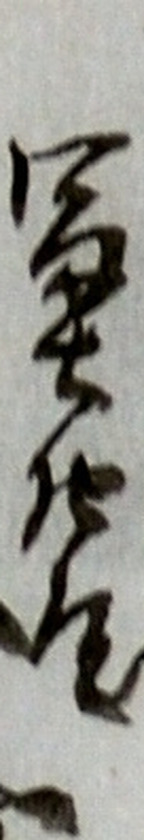富士野屋
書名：家賃下ゲ渡判取帳
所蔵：伊那市立高遠町図書館・合同会社AMANE
